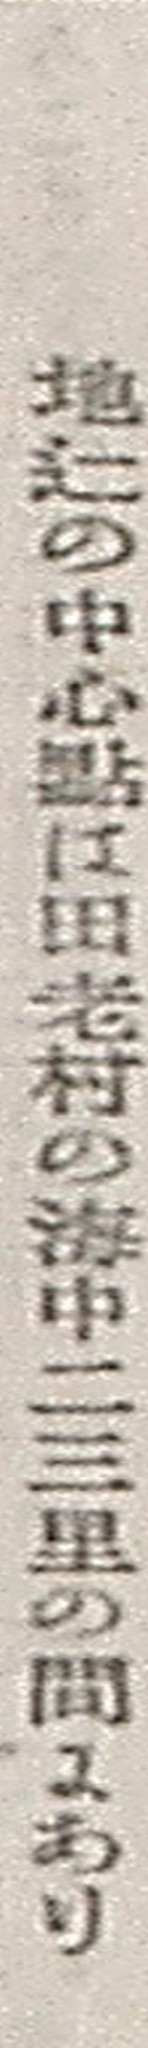地辷の中心点は田老村の海中二三里の間にあり
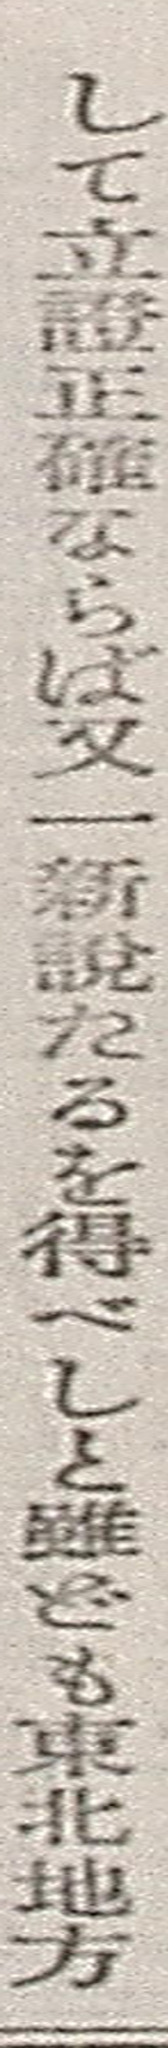して立証正確ならば又一新説たるを得べしと雖ども東北地方
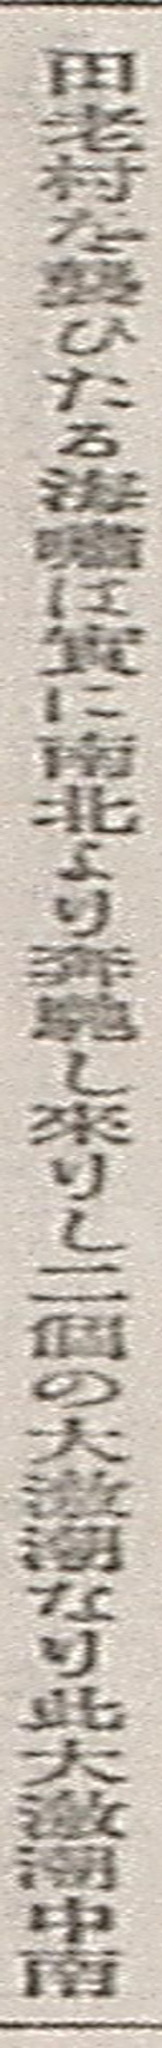田老村を襲ひたる海嘯は実に南北より奔馳し来りし二個の大激潮なり此大激潮中南
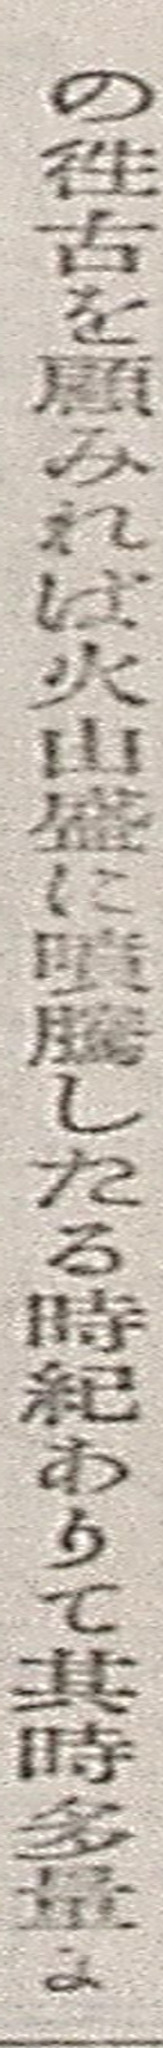の往古を顧みれば火山盛に噴騰したる時紀ありて其時多量に
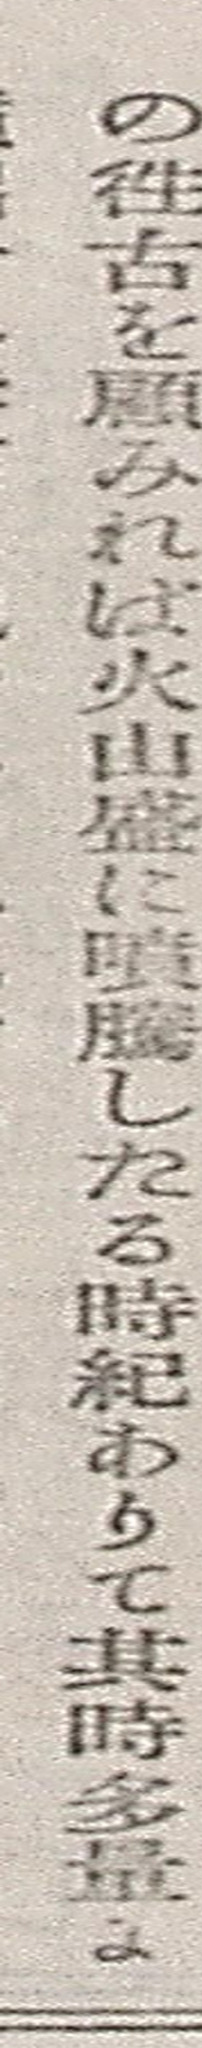の往古を顧みれば火山盛に噴騰したる時紀ありて其時多量に
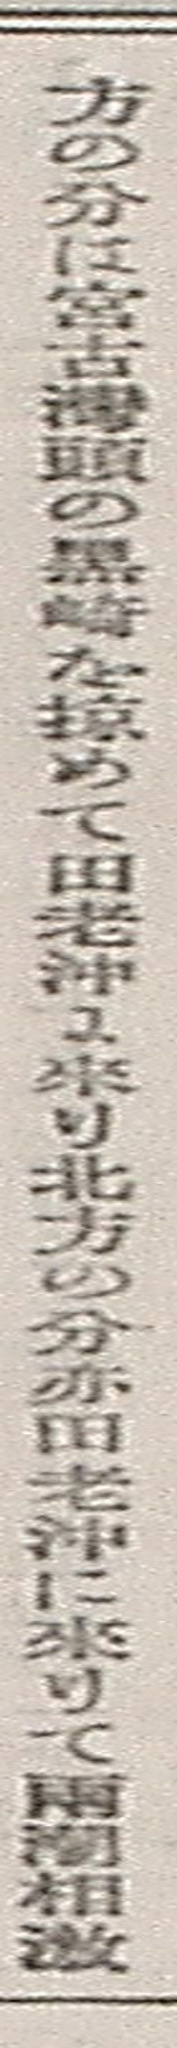方の分は宮古湾頭の黒崎を掠めて田老沖に来り北方の分亦田老沖に来りて両潮相激
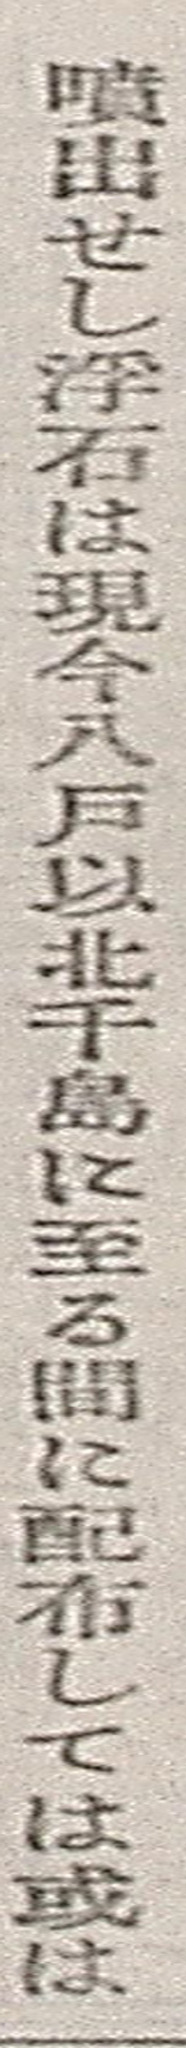噴出せし浮石は現今八戸以北千島に至る間に配布しては或は
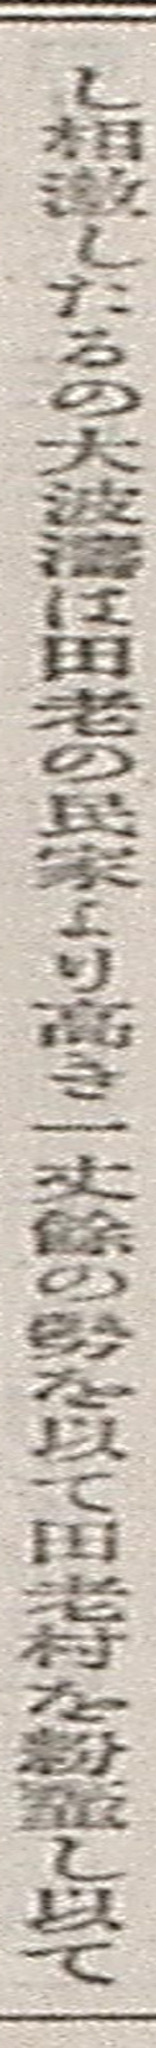し相激したるの大波濤は田老の民家より高き一丈余の勢を以て田老村を紛韲し以て
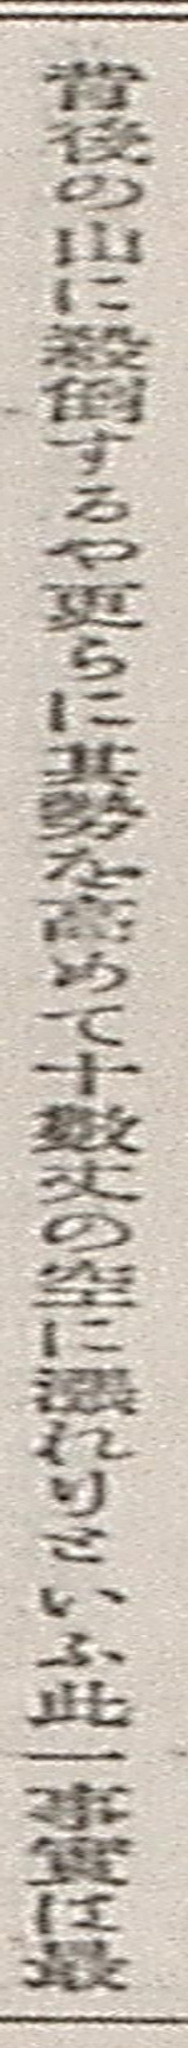背後の山に殺到するや更らに其勢を高めて十数丈の空に漲れりといふ此一事実は最
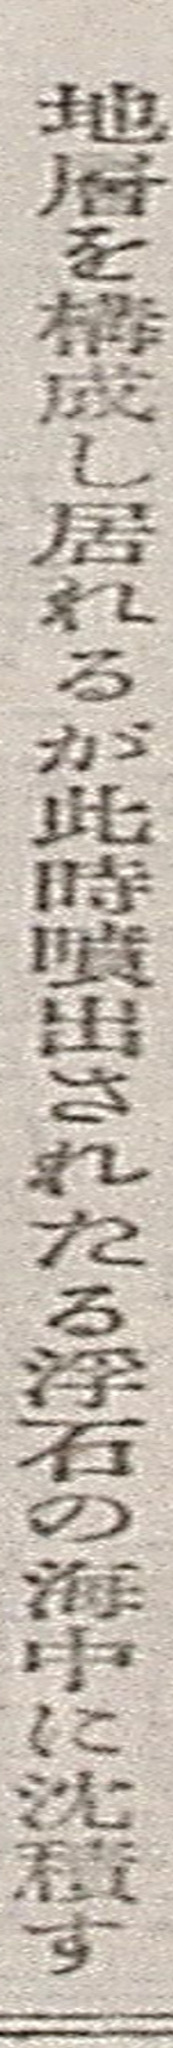地層を構成し居れるが此時噴出されたる浮石の海中に沈積す
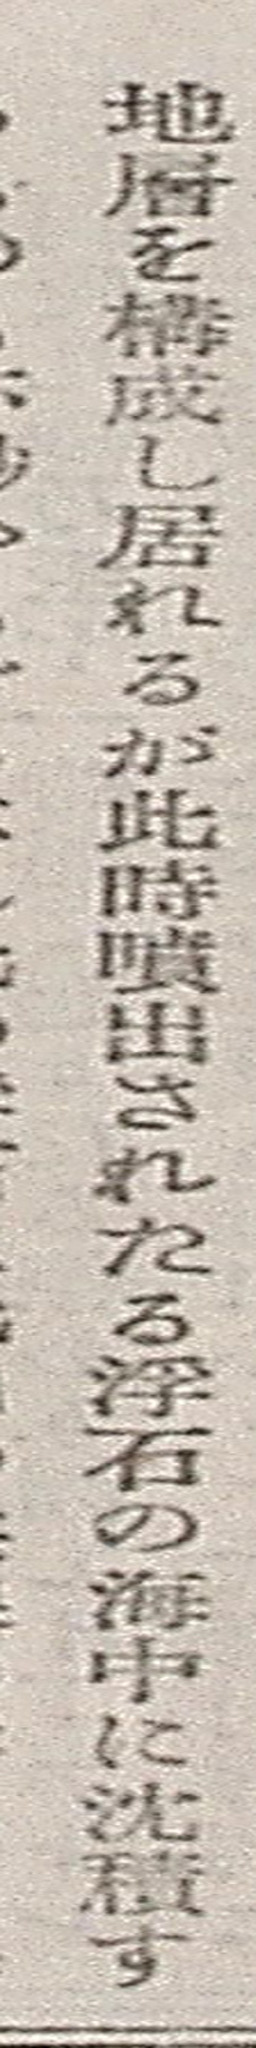地層を構成し居れるが此時噴出されたる浮石の海中に沈積す
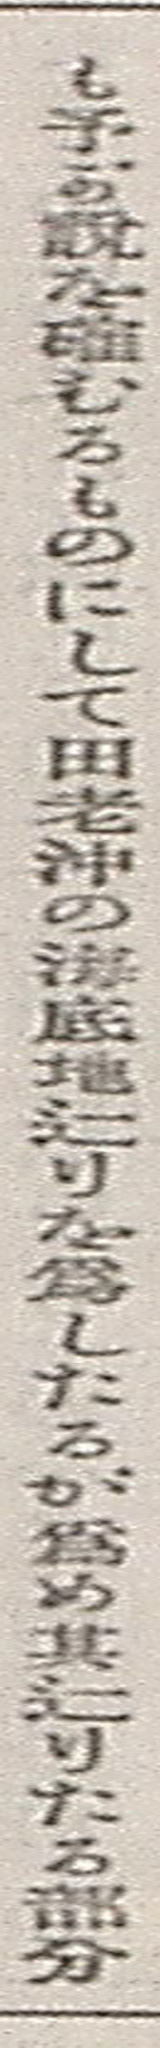も予が説を確むるものにして田老沖の海底地辷りを為したるが為め其辷りたる部分
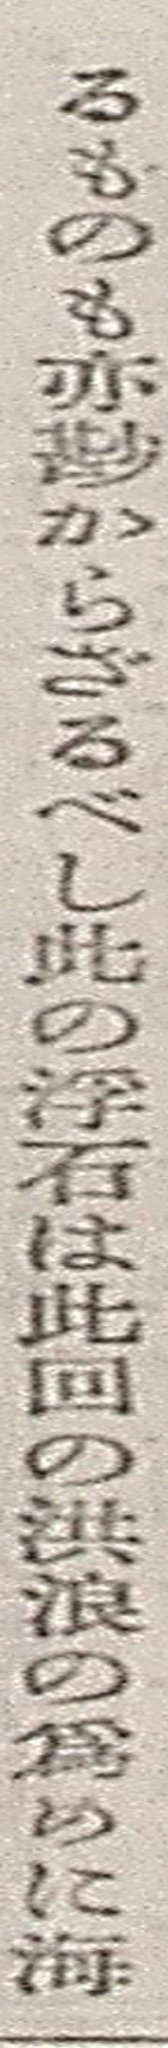るものも亦尠からざるべし此の浮石は此回の洪浪の為めに海
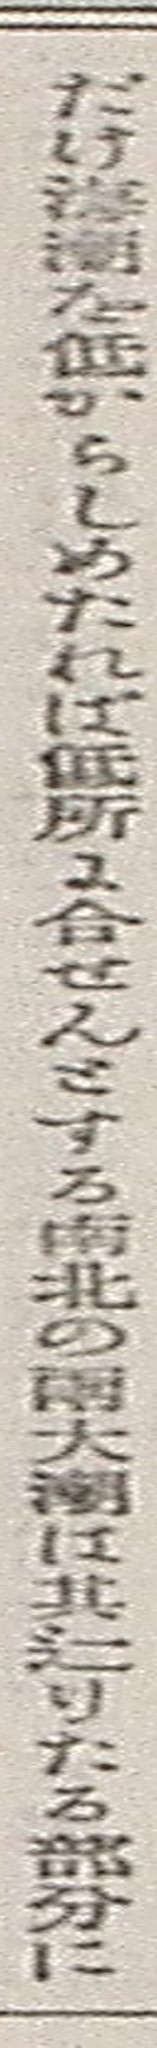だけ海潮を低からしめたれば低所に合せんとする南北の両大潮は其辷りたる部分に
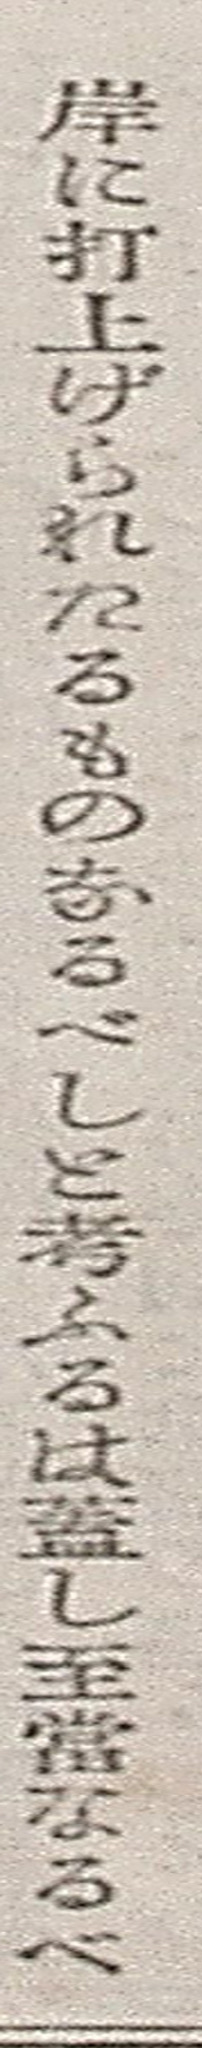岸に打上げられたるものなるべしと考ふるは蓋し至当なるべ
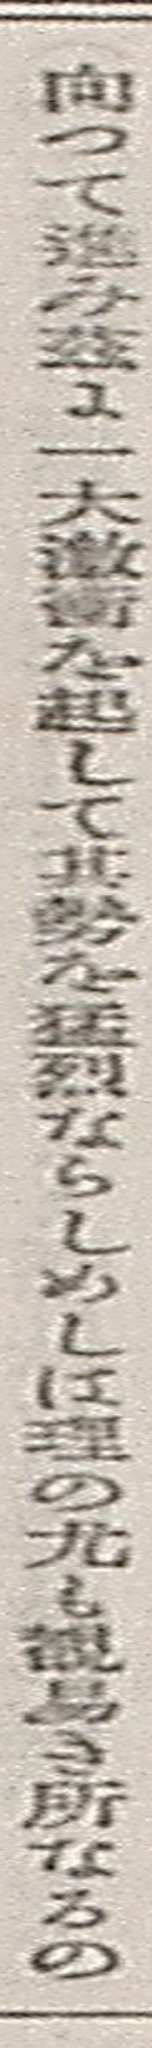向つて進み茲に一大激衝を起して其勢を猛烈ならしめしは理の尤も観易き所なるの
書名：風俗畫報臨時増刊第百十九號　大海嘯被害録（中）
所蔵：東京大学地震研究所図書室 Earthquake Research Institute Library, The University of Tokyo, JAPAN
